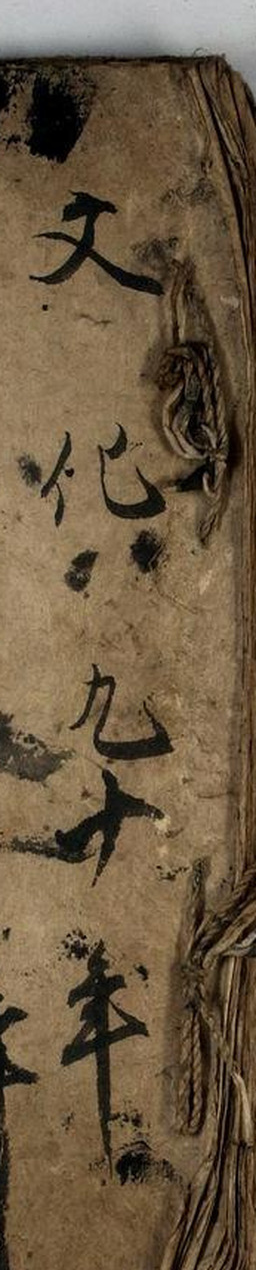文化九十年
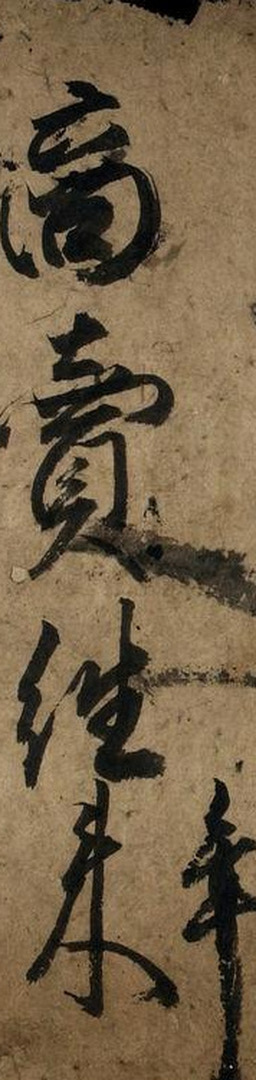商売往来

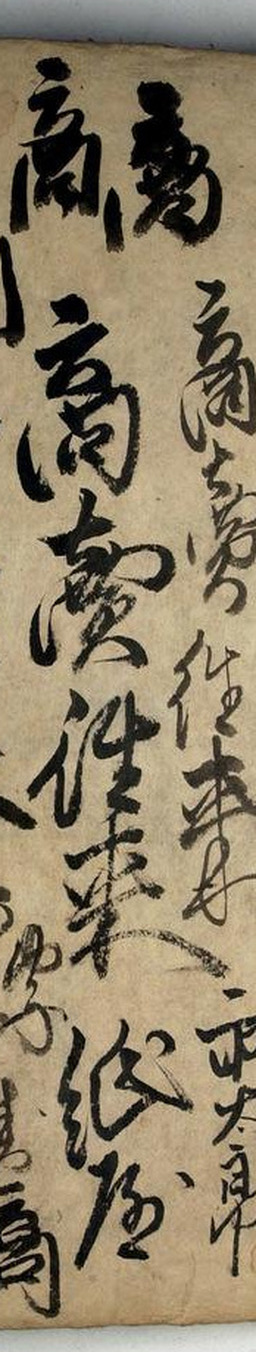商商売往来紙屋
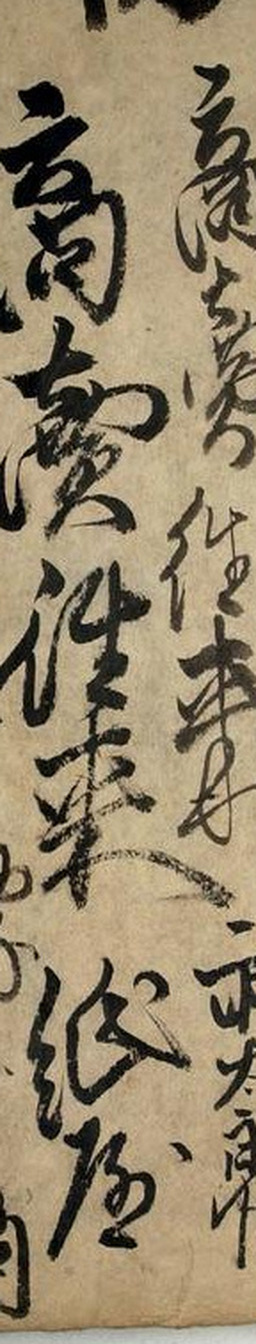商商売往来紙屋
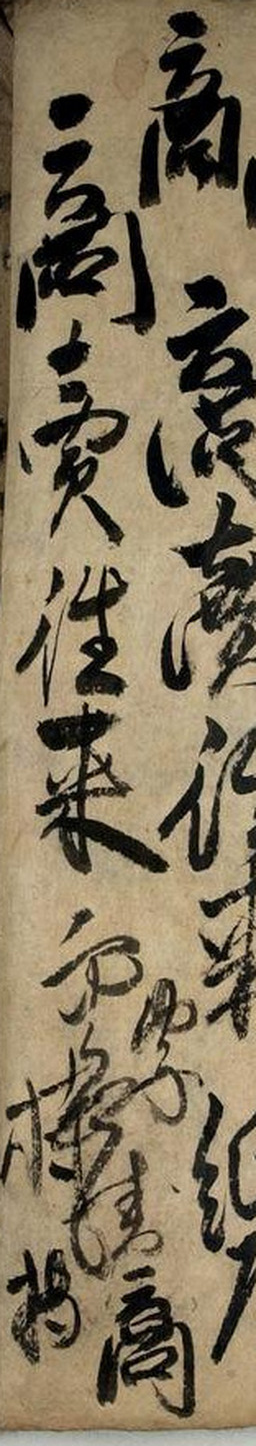商売往来取持
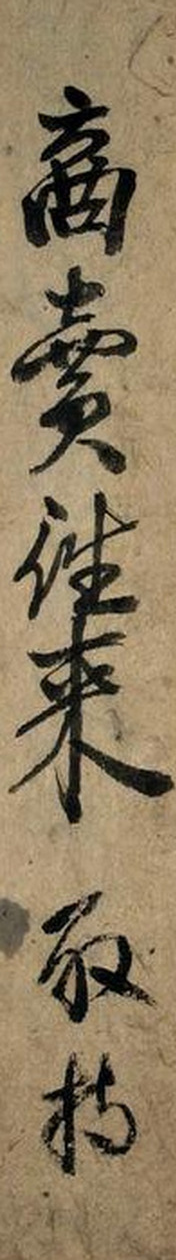商売往来取持
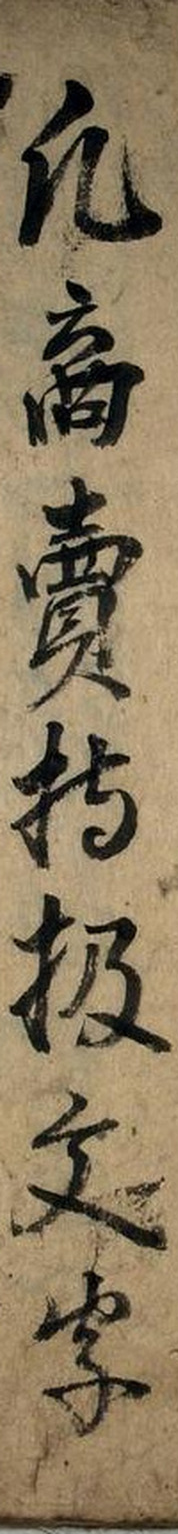凡商売持扱文字
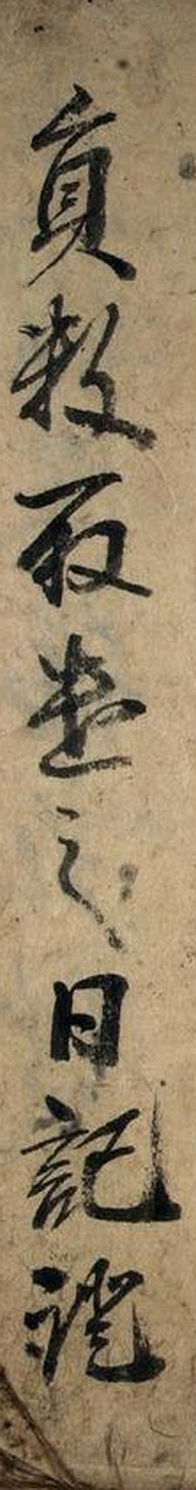員数取遣之日記証

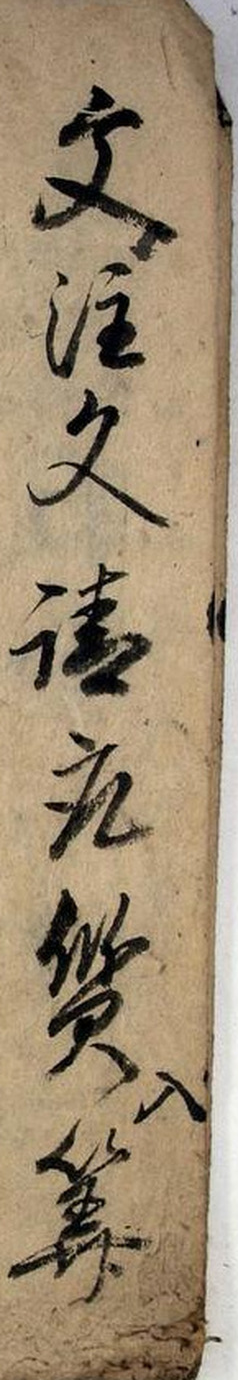文注文請取質入算
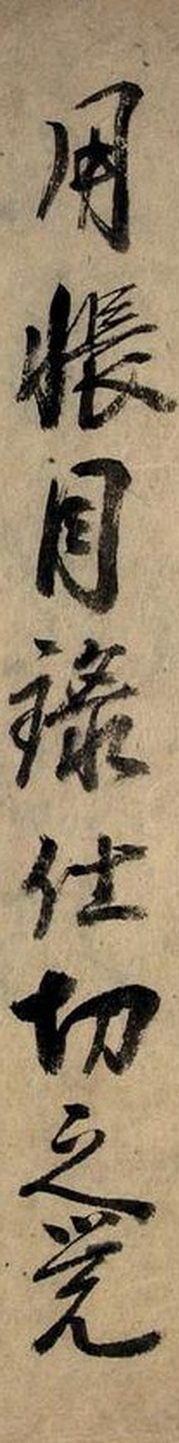用帳目録仕切之覚
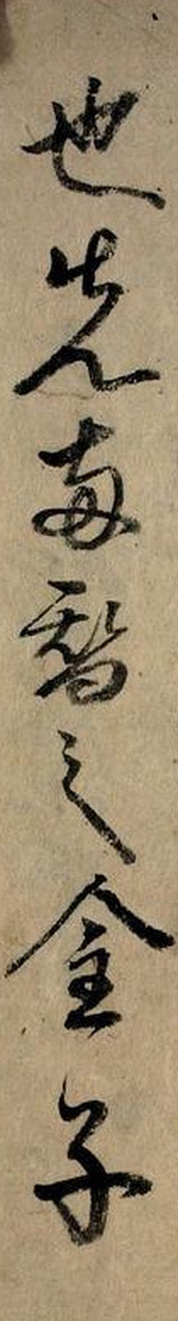也先両替之金子
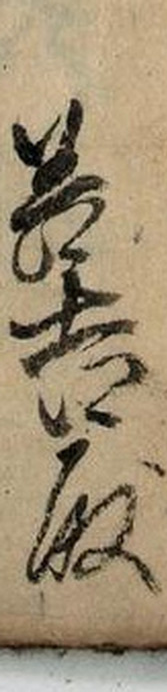善吉殿
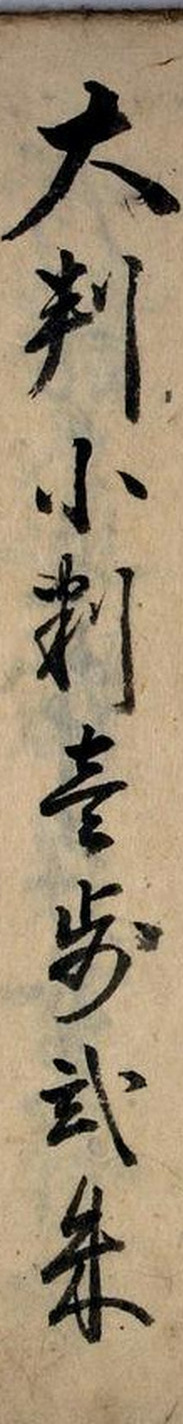大判小判壱歩朱
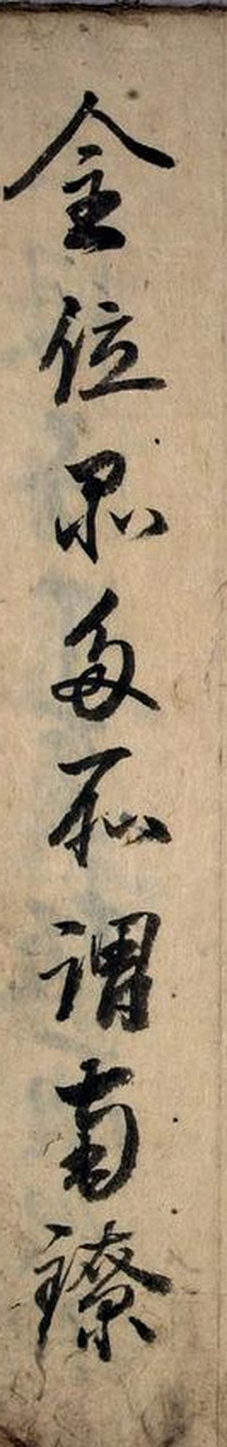金位品匁所謂南寮鐐

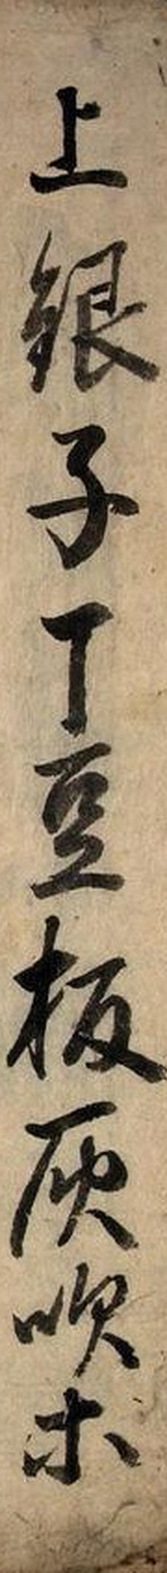上銀子丁豆板灰吹等
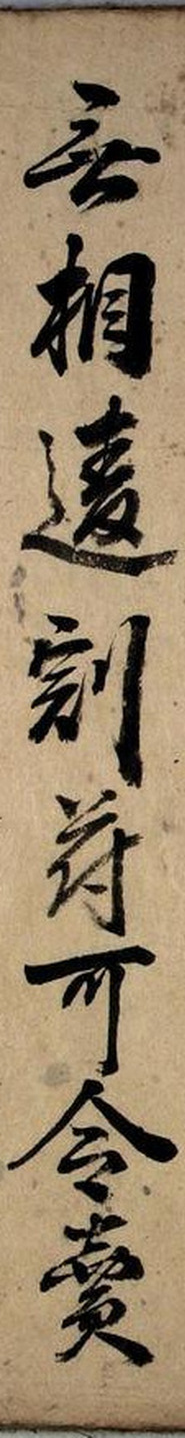無相違割符可令売
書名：商売往来（往来物、手習）
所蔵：福井県文書館 Fukui Prefectural Archives
